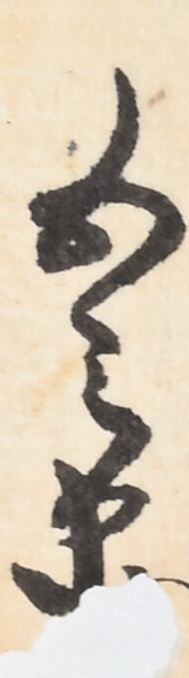五兵衛
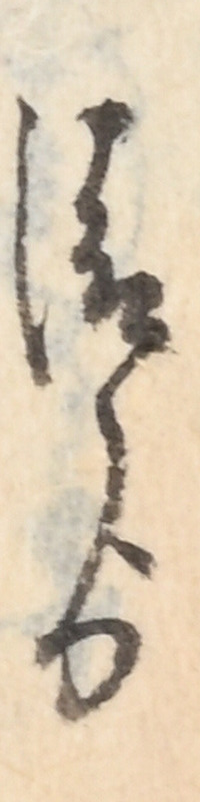平右衛門
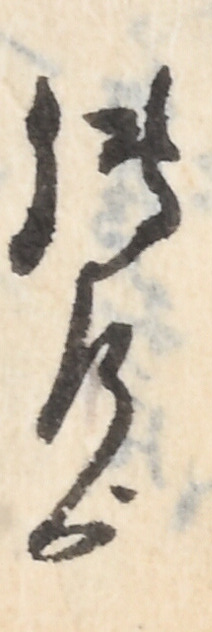六左衛門
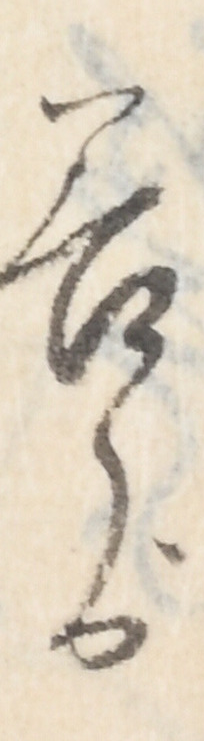久兵衛

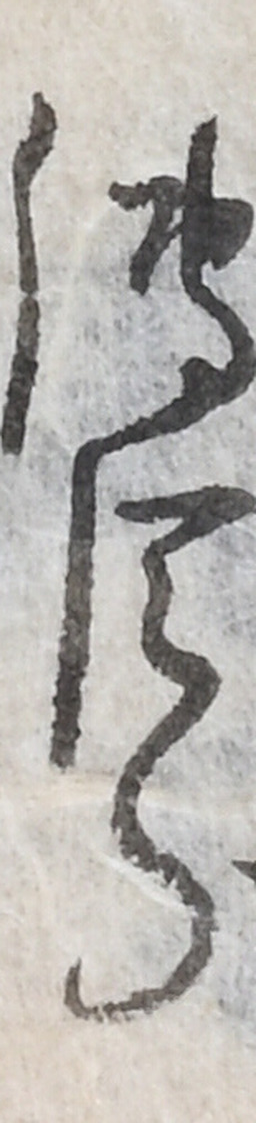善四郎
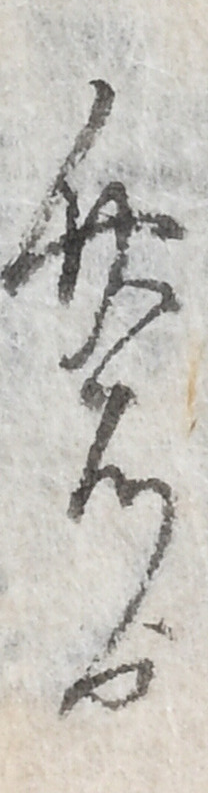喜右衛門
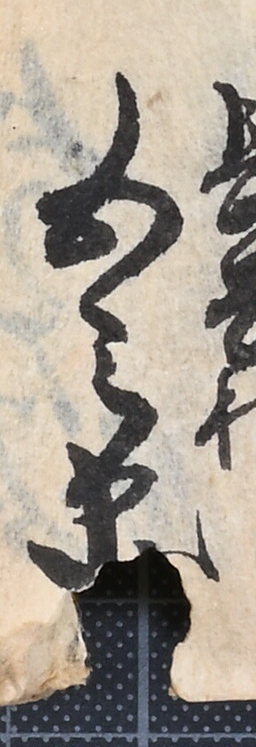仁兵衛
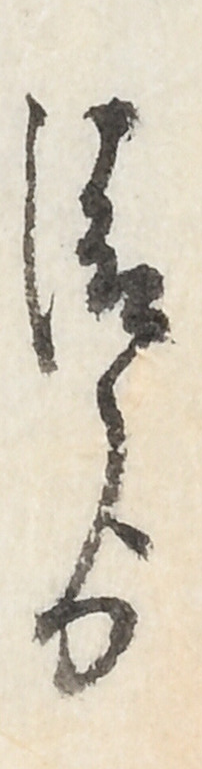清右衛門
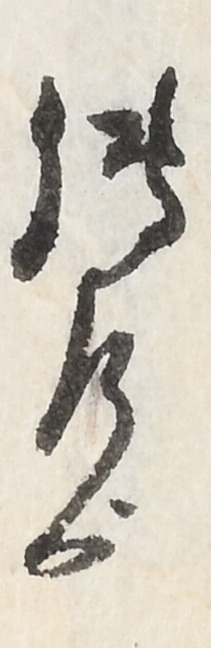伝左衛門
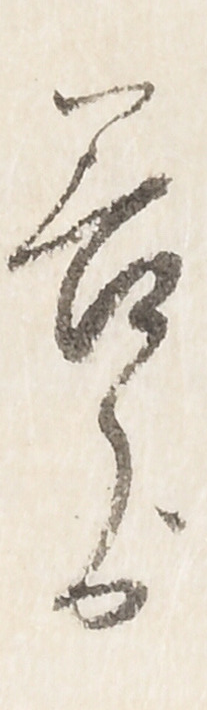善右衛門
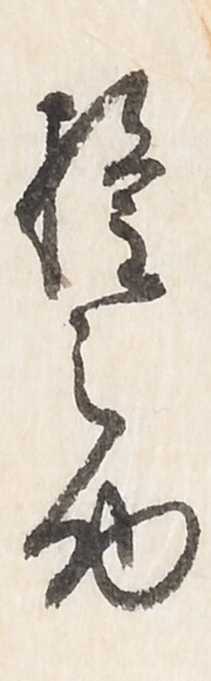権之助
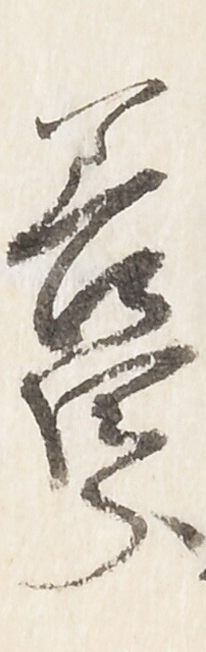善四郎
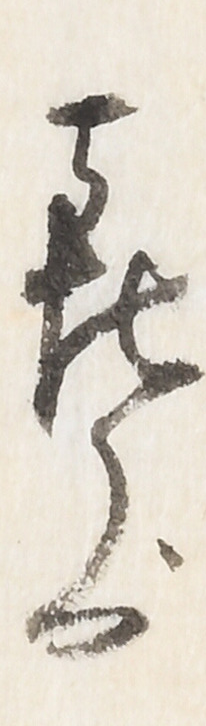仁兵衛
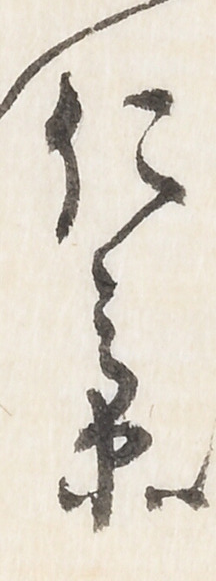仁兵衛
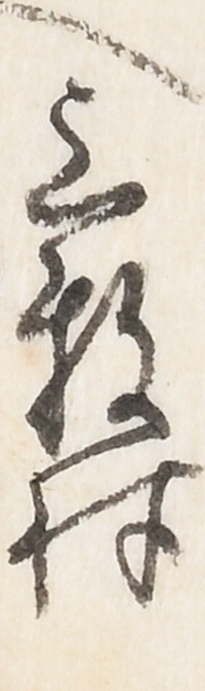上牧村
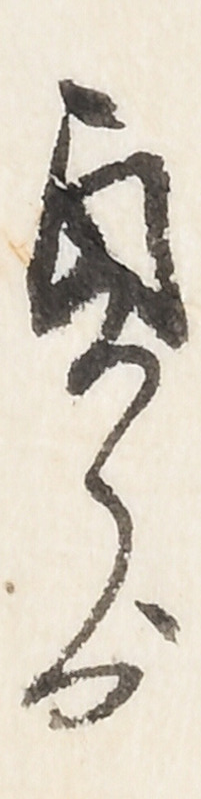貞右衛門
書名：合力覚帳
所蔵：伊那市立高遠町図書館・合同会社AMANE
